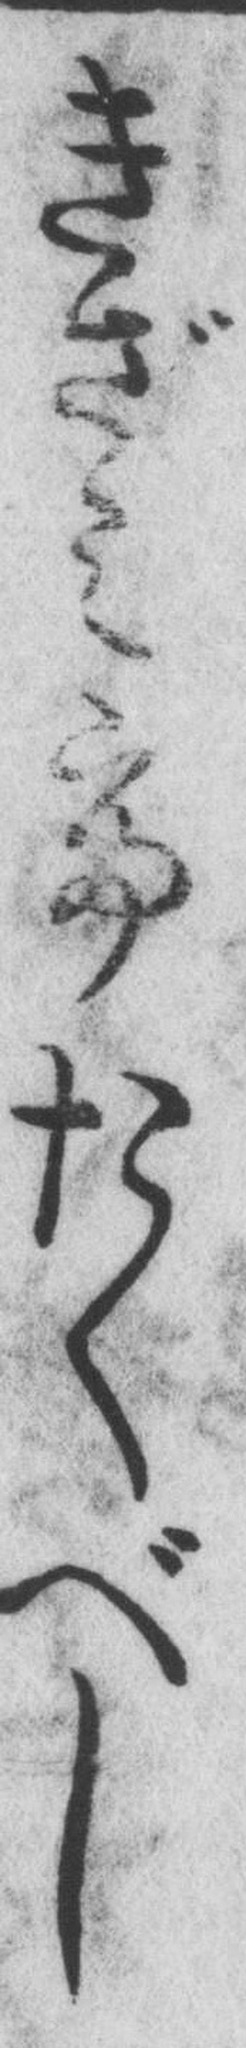きざみ亭たくべし
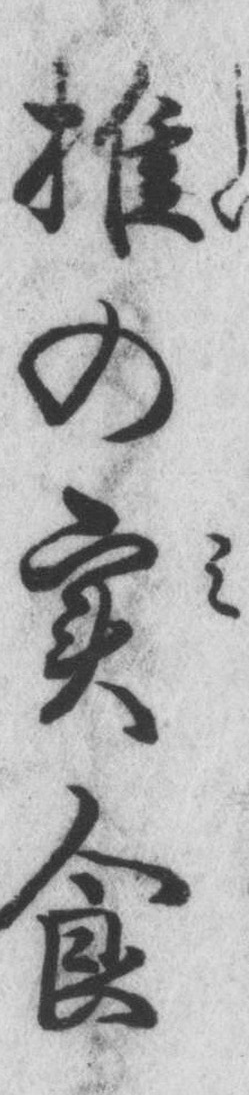椎の実食
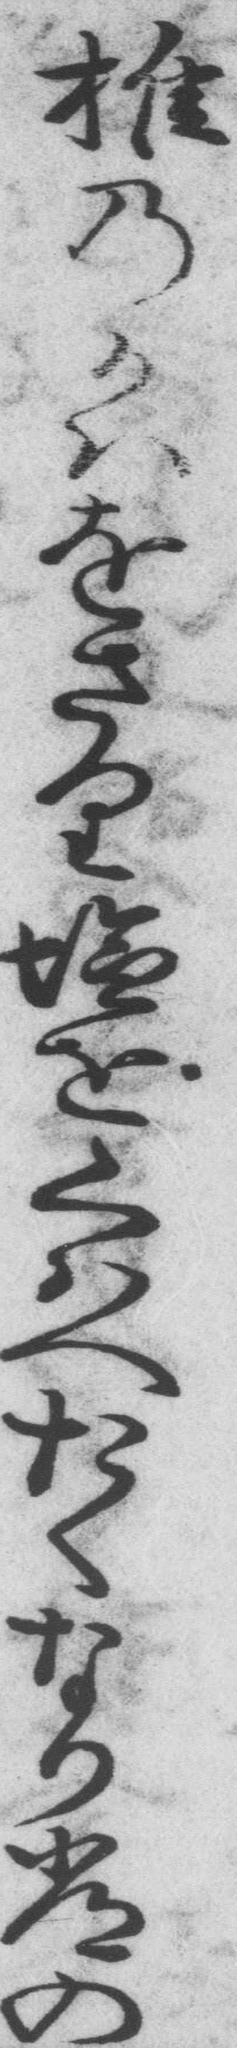椎乃かはをき里塩をくはへたくなり常の
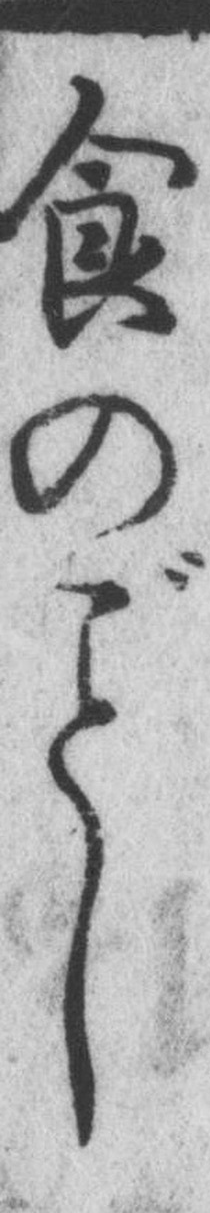食のごとし
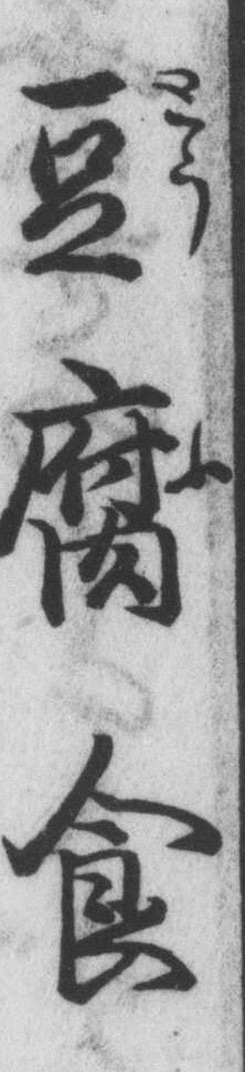豆腐食
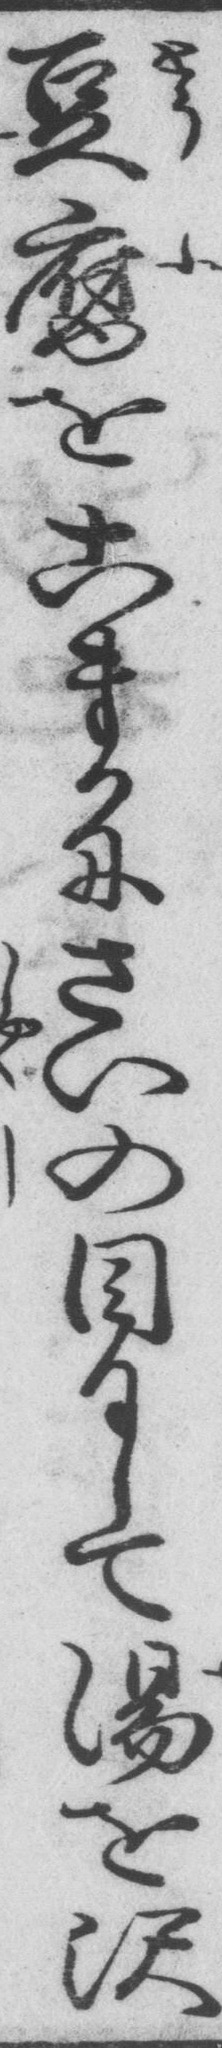豆腐を古まか丹さいの目尓して湯を沢
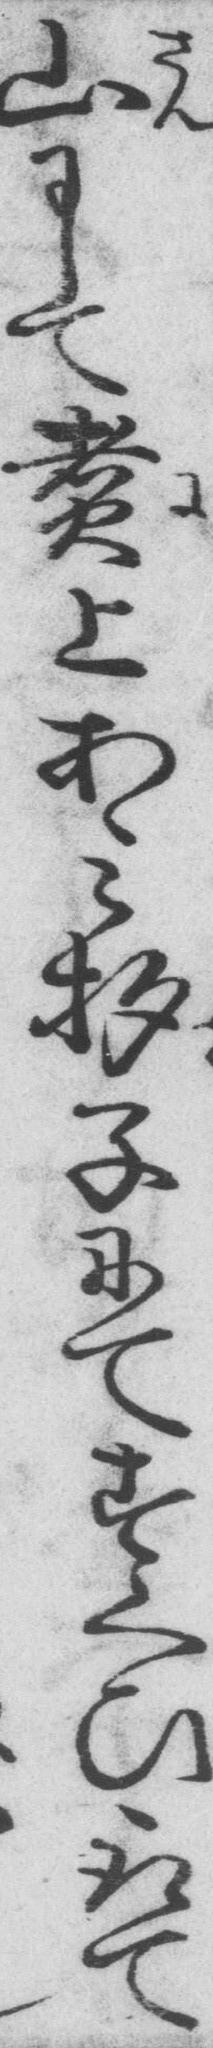産山尓して煮上あみ杓子丹て春くひ取て
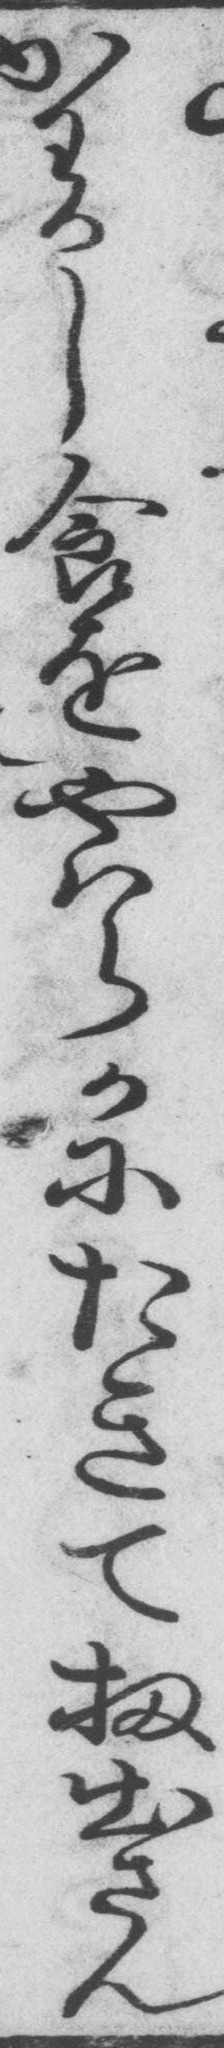かわかし食をやはらか尓たきて扨出さん
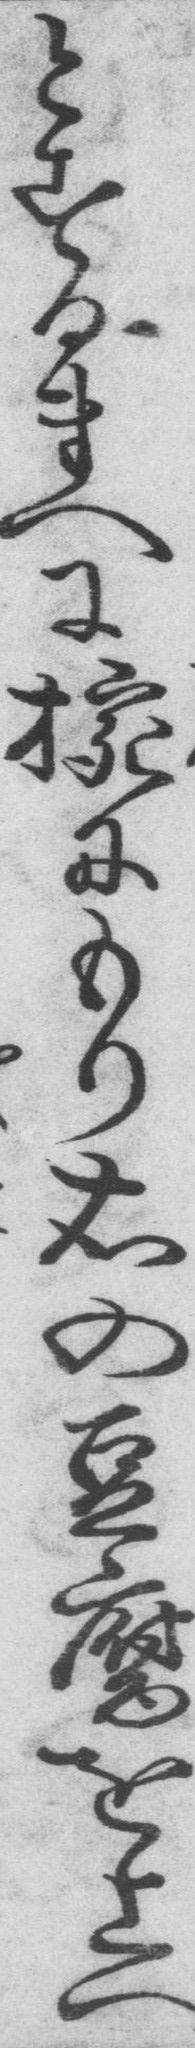と春るまへ尓椀丹もり右の豆腐を上へ
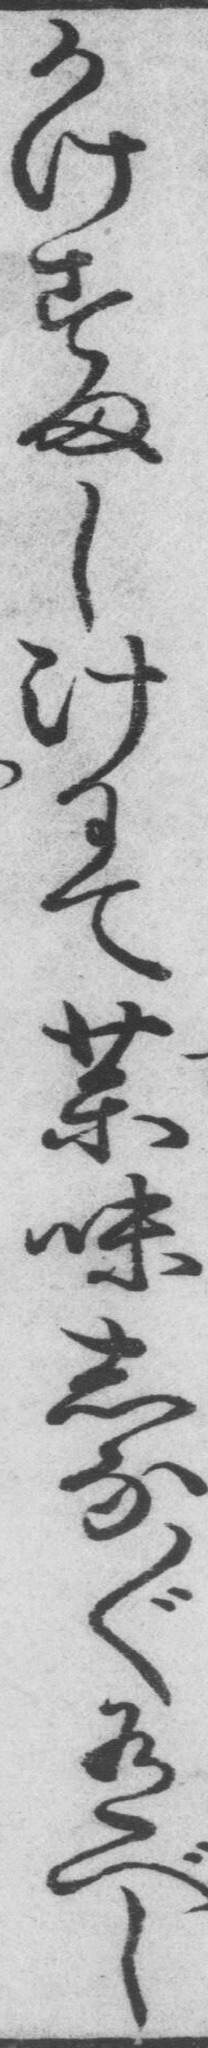かけ春まし汁尓て薬味志な〴〵有べし
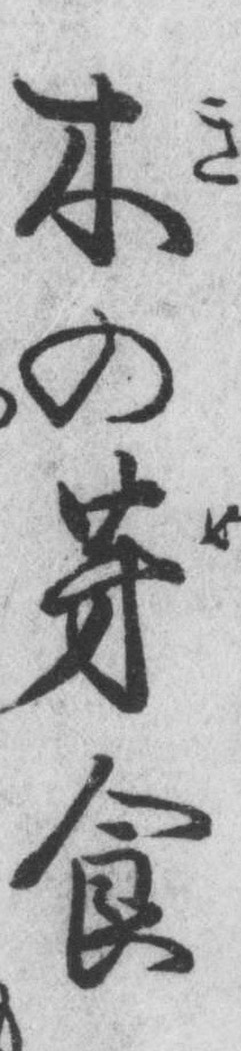木の芽食
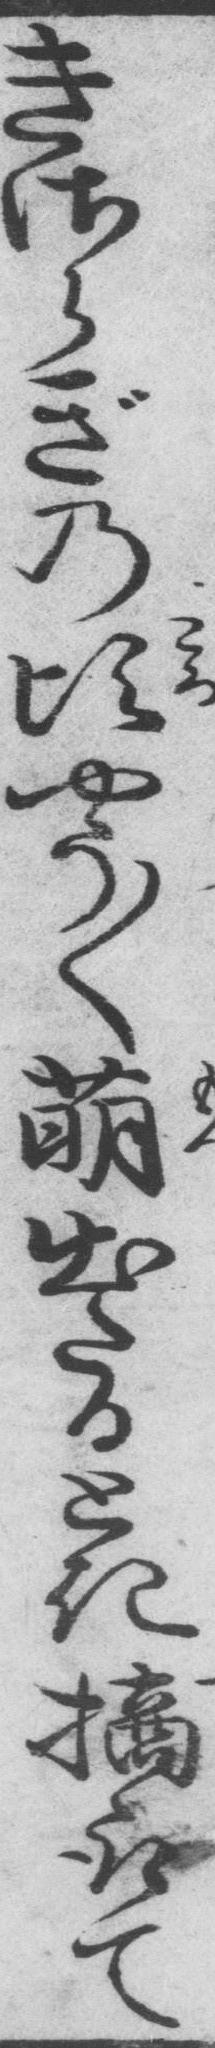き佐らぎ乃頃やう〳〵萌出たると起摘取て
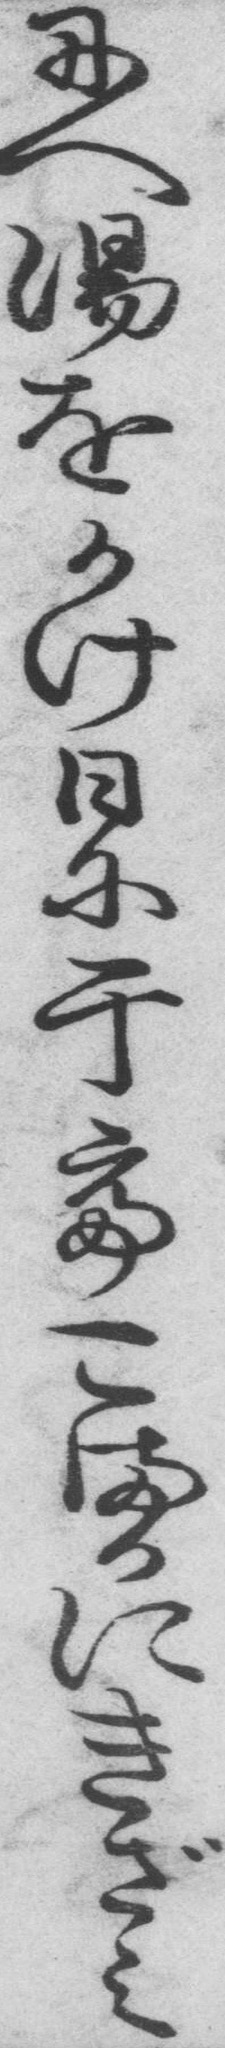丹へ湯をかけ日尓干亭こ満かにきざみ

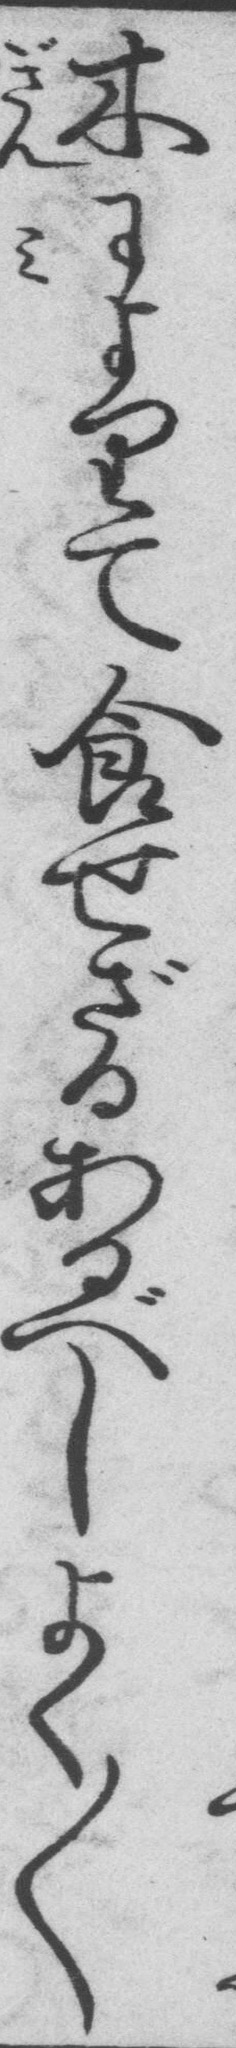木尓よ里て食せざるあるべしよく〳〵
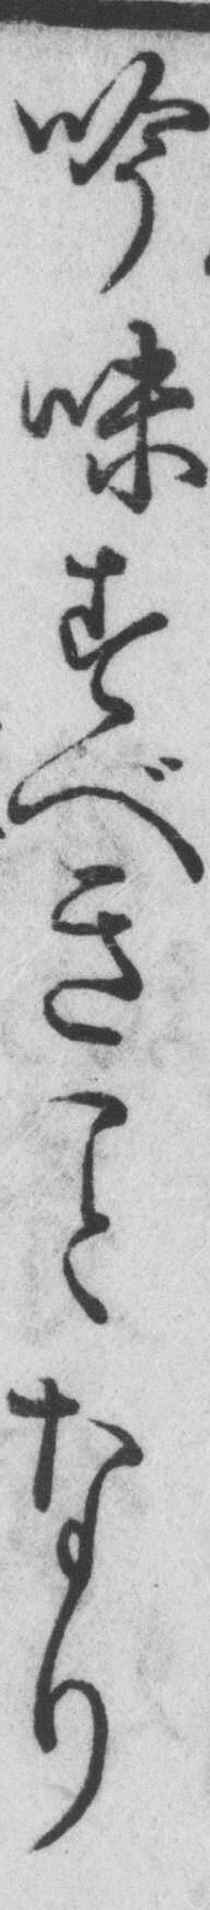吟味春べきことなり
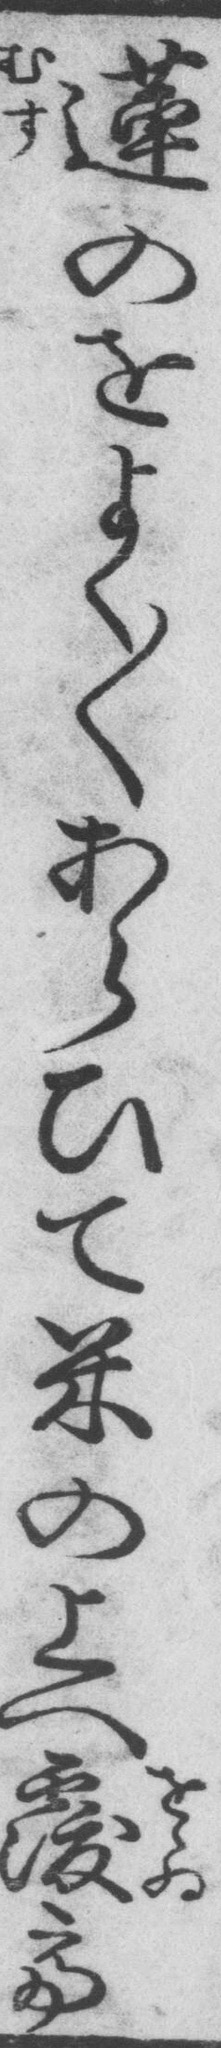蓮のをよく〳〵あらひて米の上へ覆亭
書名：料理伊呂波庖丁
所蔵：大阪府立大学学術情報センター 国文学研究資料館
